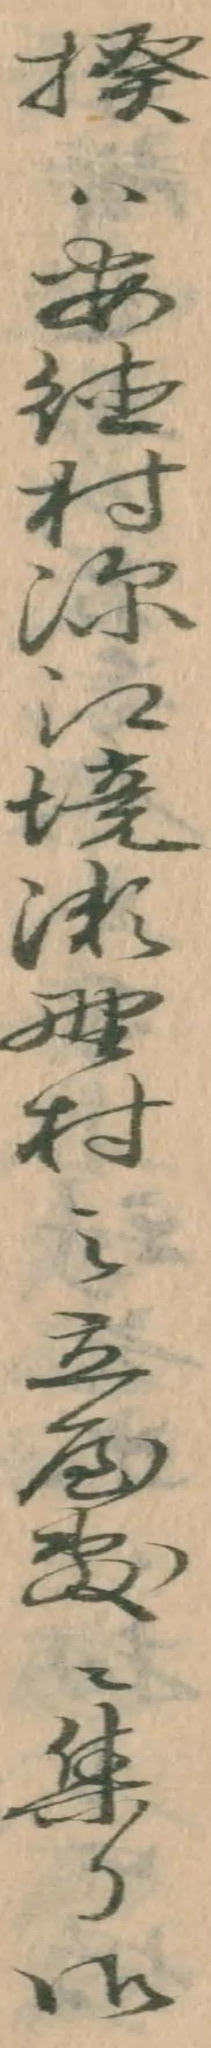揆は安徳村深江境瀬野村之立屋敷に集り御
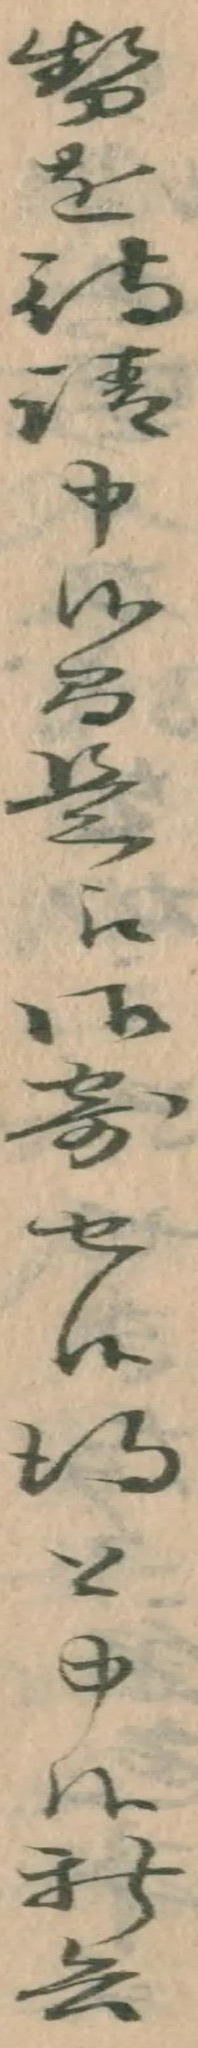勢を待請申候間是え御寄せ候得と申候新兵
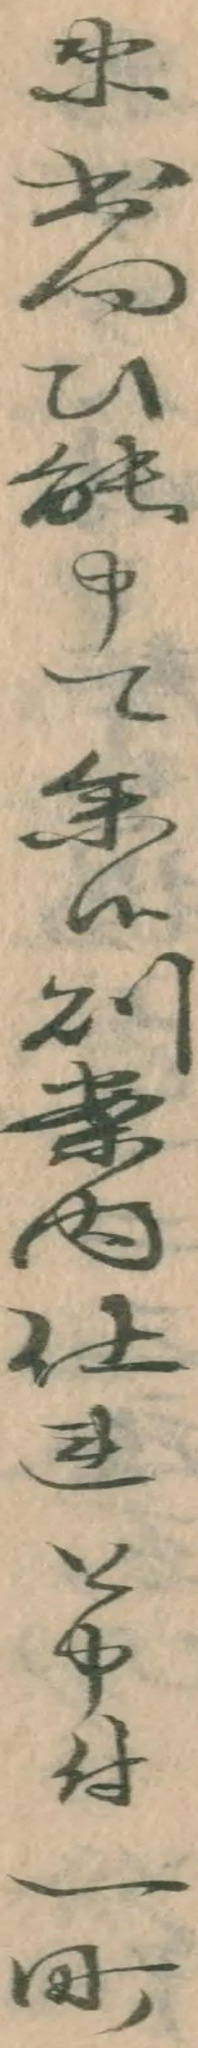衛出向ひ能申て参候則案内仕れと申付一町
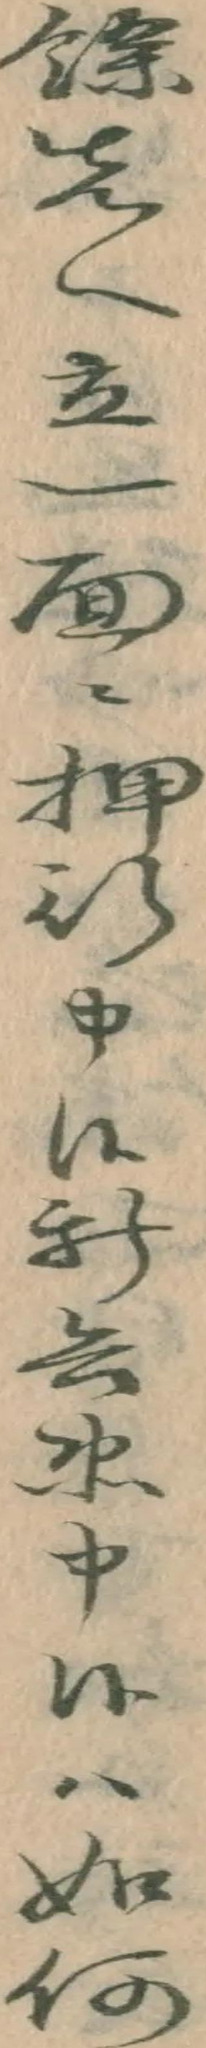余先へ立一面に押行申候新兵衛申候は如何
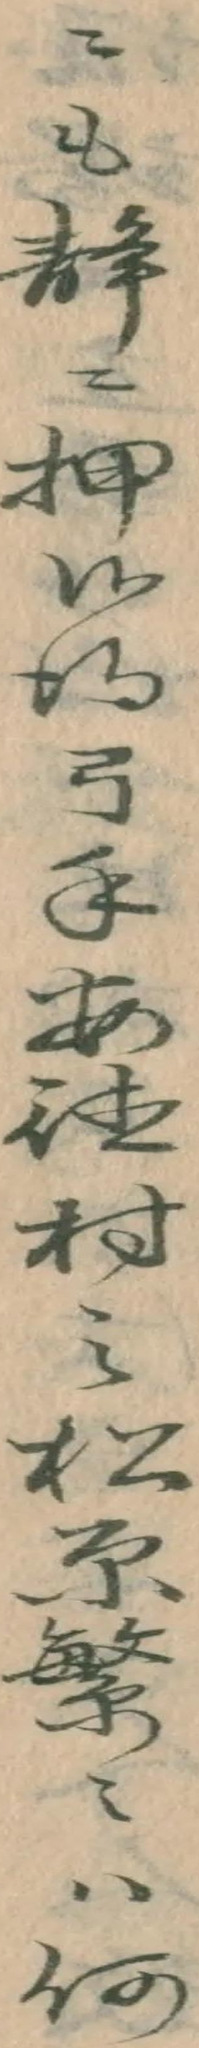にも静に押候得弓手安徳村之松原繁には何
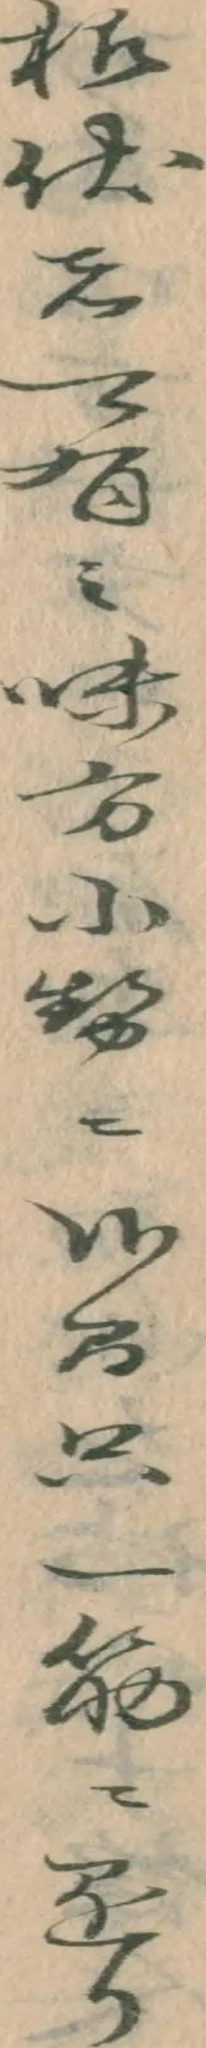様伏者可有之味方小勢に候間只一筋に懸り
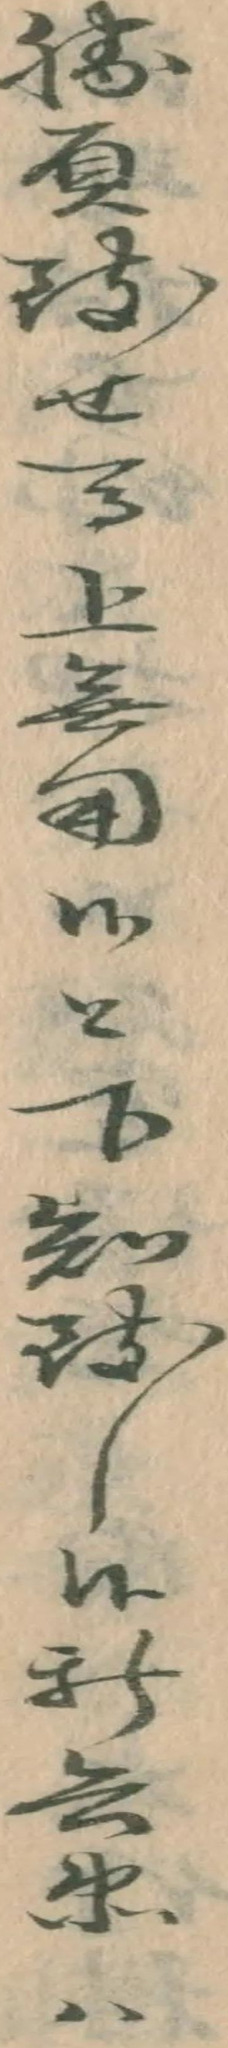勝負致せ馬上無用候と下知致し候新兵衛は
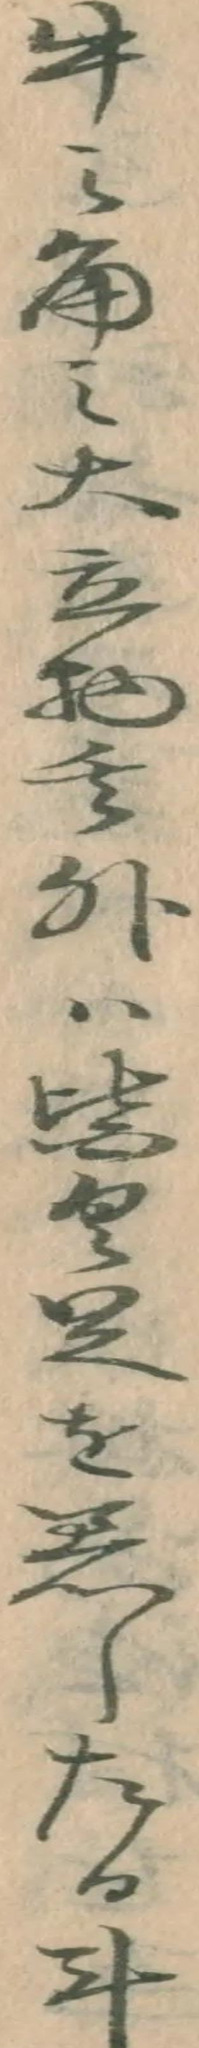牛の角之大立物其外は皆具足を着したる斗
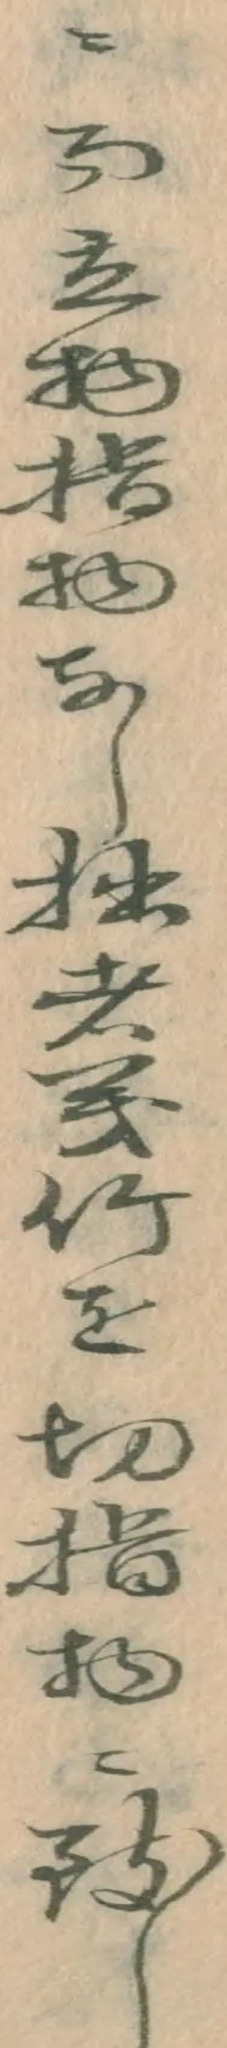に而立物指物なし拙者義竹を切指物に致し

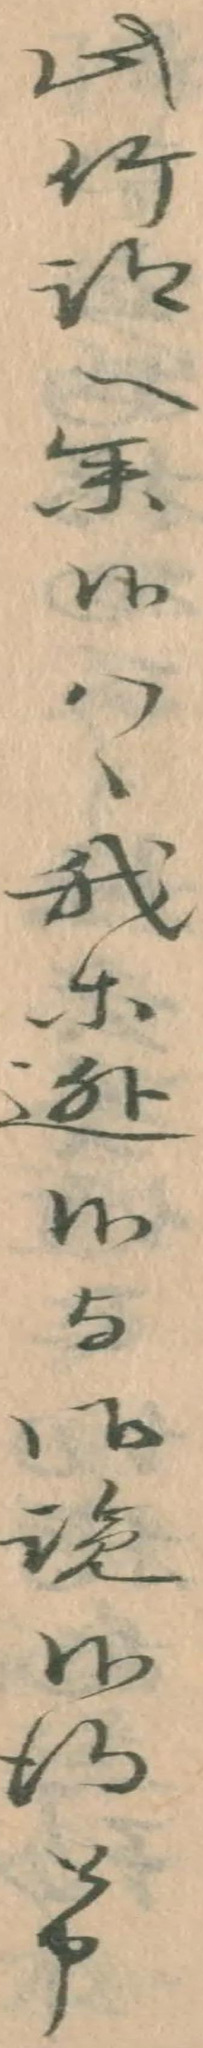此竹跡へ参候はゝ我等逃候与御覧候得と申
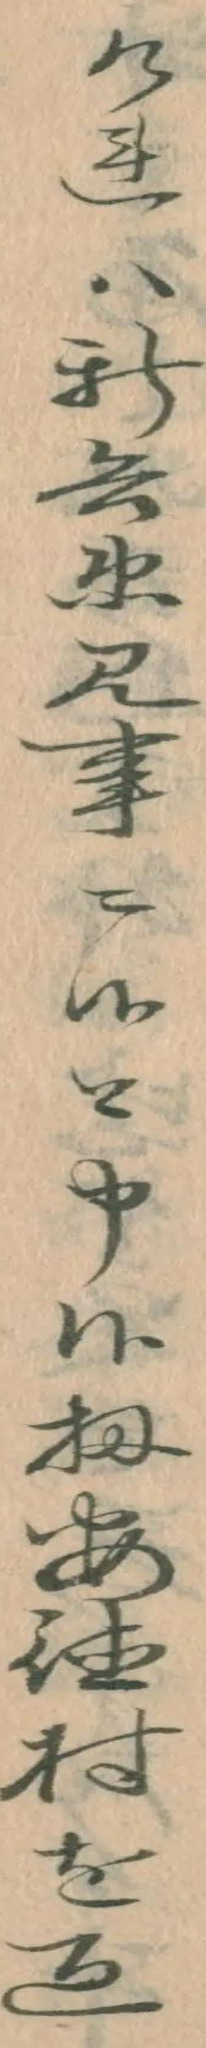けれは新兵衛見事に候と申候扨安徳村を過
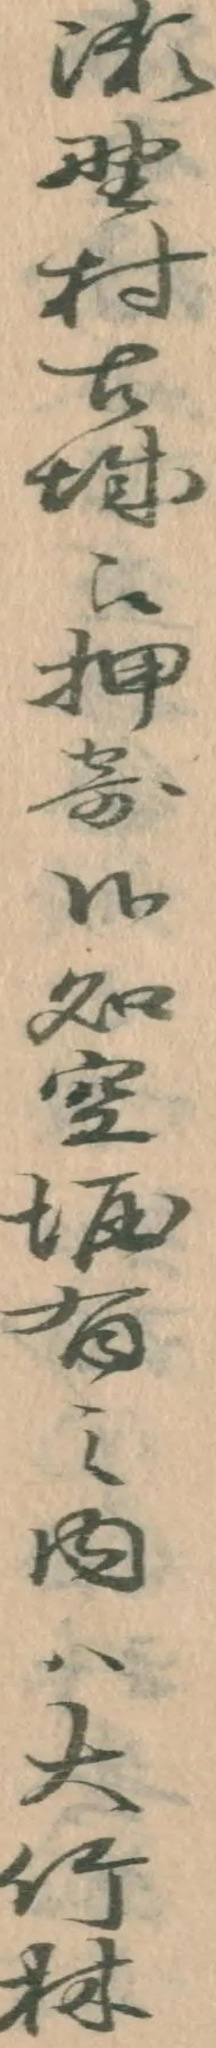瀬野村古城え押寄候処空堀有之内は大竹林
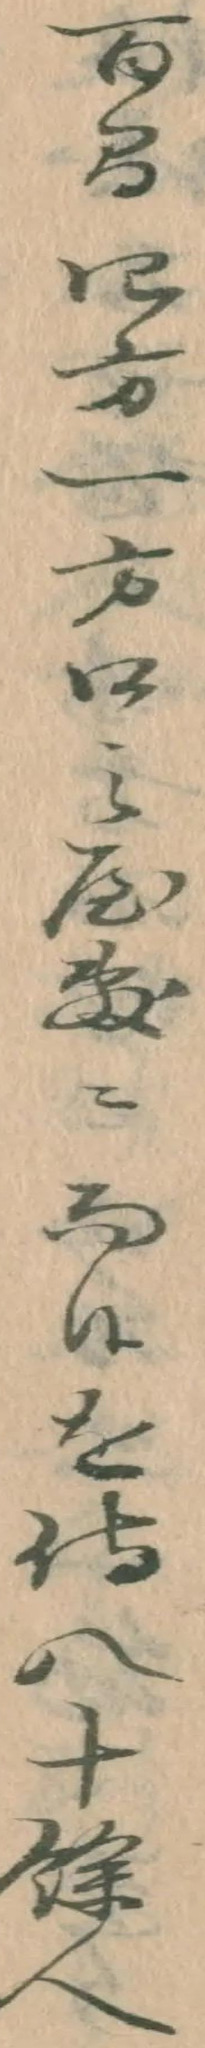百間四方一方口之屋敷に而候を侍八十余人
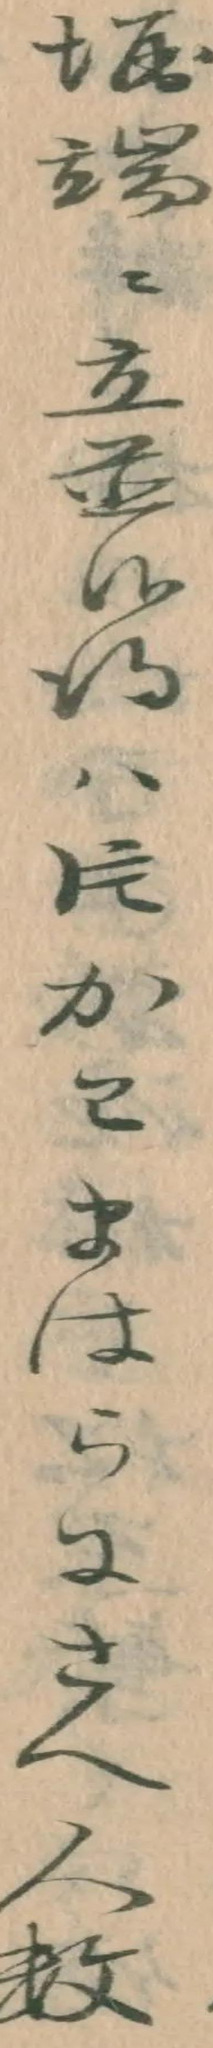堀端に立並候得は片かわまはらにさへ人数
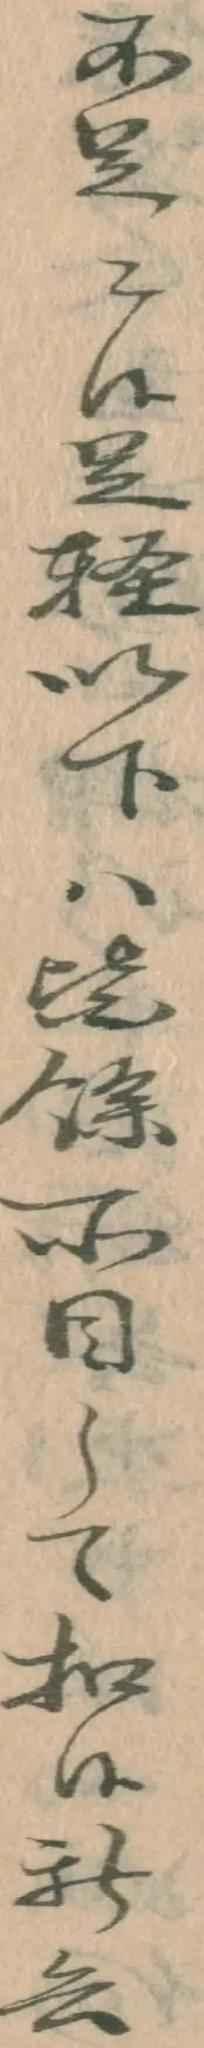不足に候足軽以下は皆余所目して扣候新兵
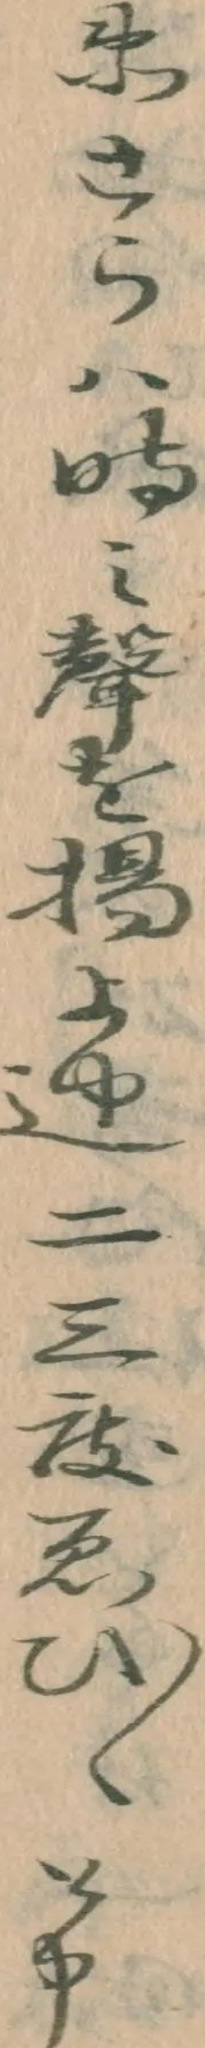衛さらは時之声を掲よ迚二三度えひ〳〵と申
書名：切支丹御退治記 49巻. [1]
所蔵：国立国会図書館 National Diet Library, JAPAN
